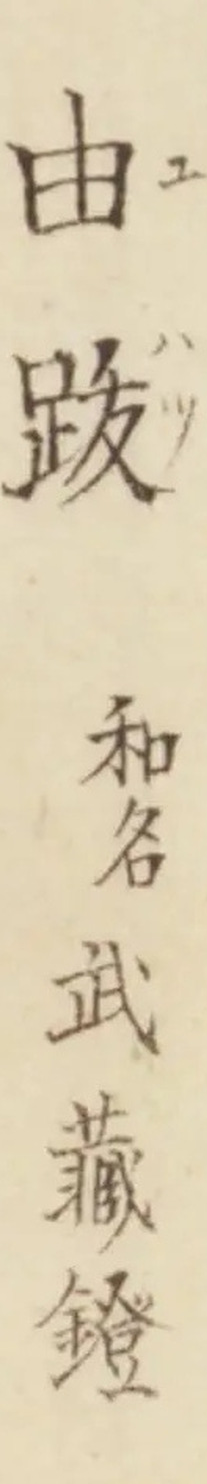由跋和名武藏鐙
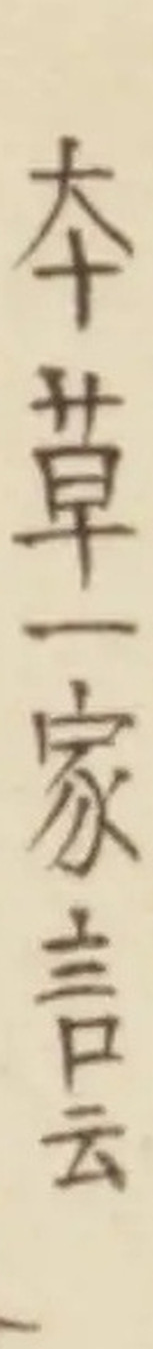本草一家言云
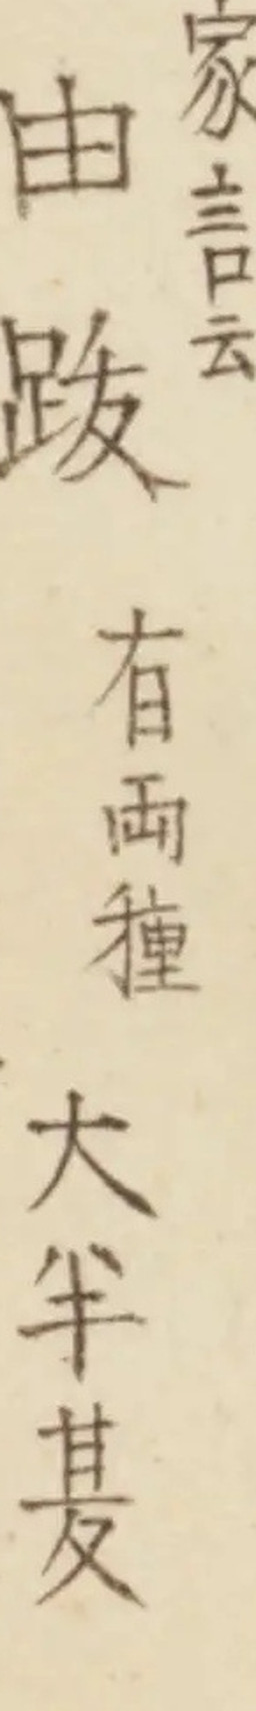由跋有両種大半夏
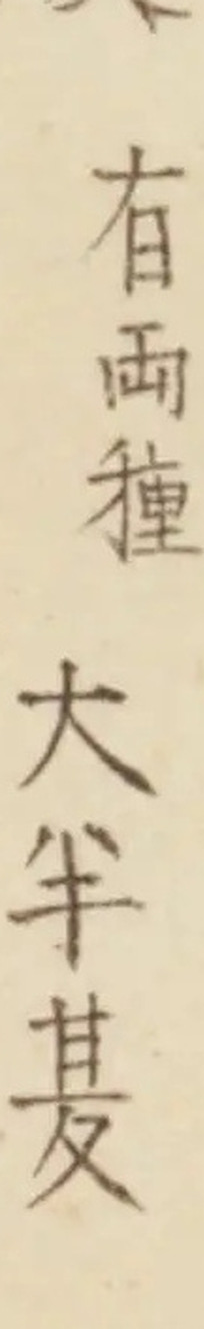由跋有両種大半夏
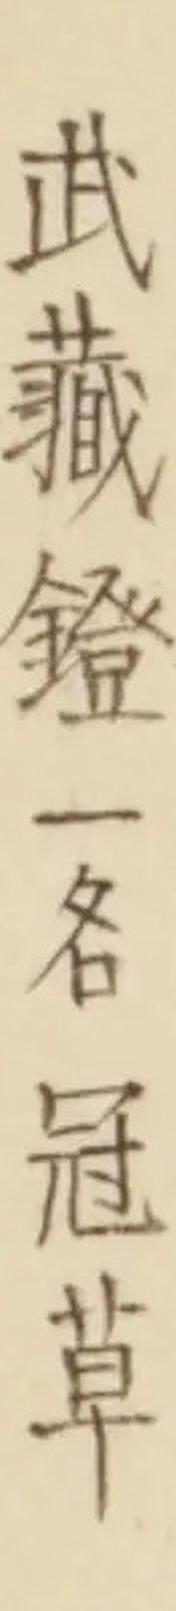武藏鐙一名冠草

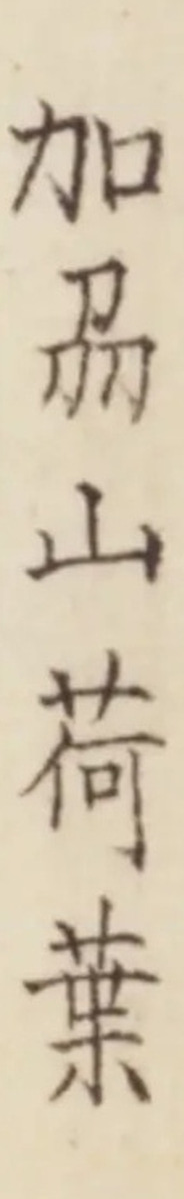加刕山荷葉
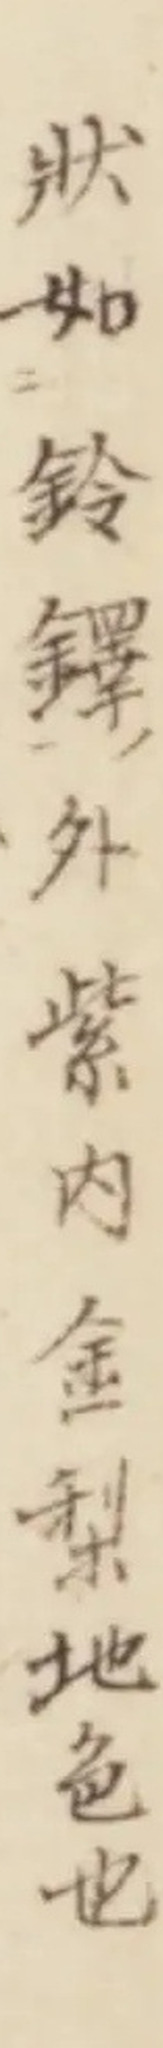状如鈴鐸の外紫内金梨地色也
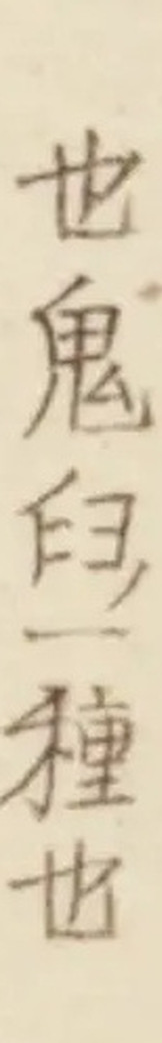也鬼臼の一種也

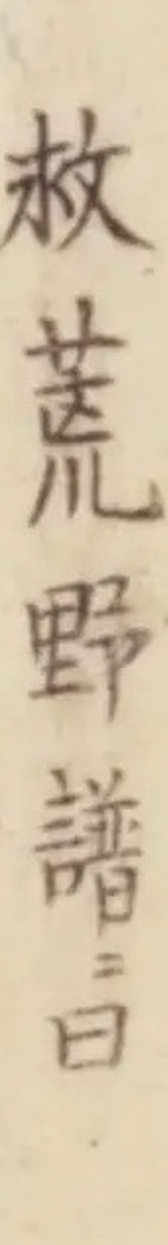救荒野譜に曰く
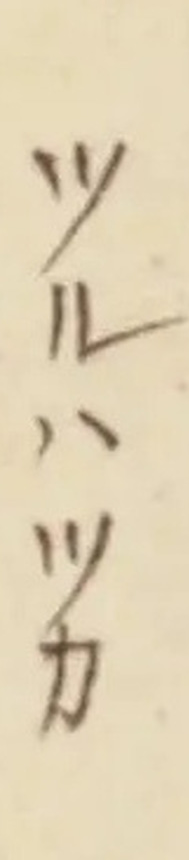ツルハツカ
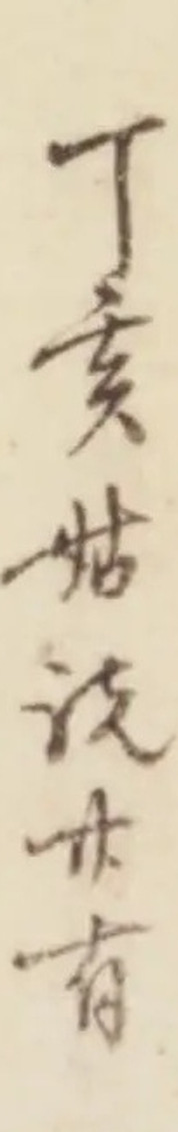丁亥姑洗廿有
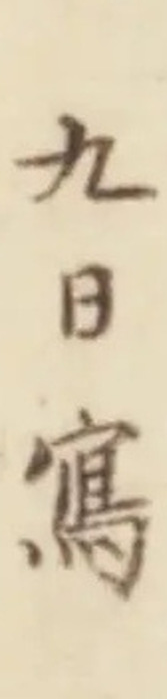九日寫

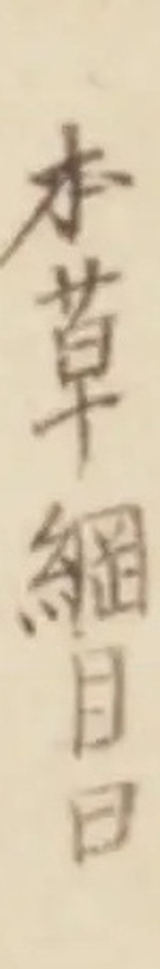本草綱目曰
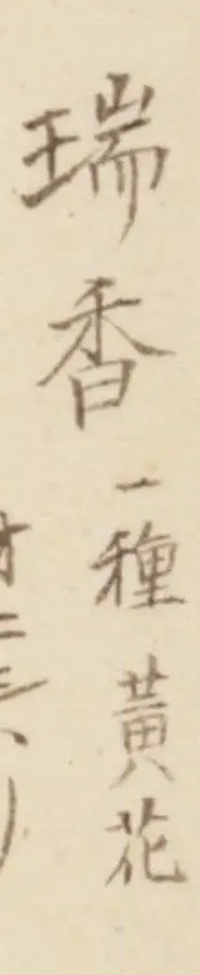瑞香一種黄花
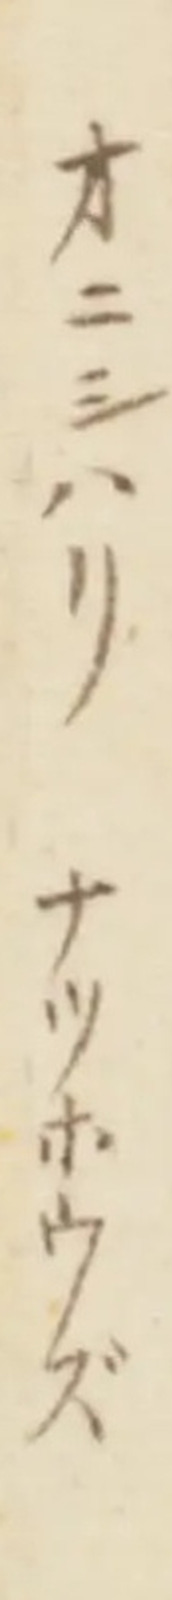オニシハリナツホウズ
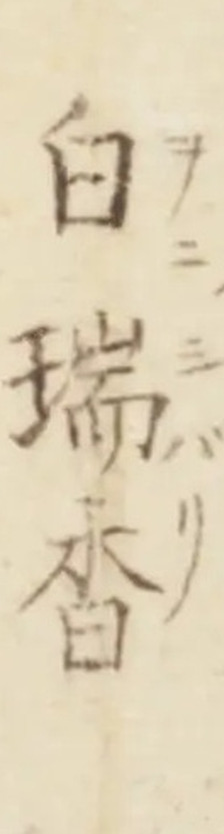白瑞香
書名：梅園草木花譜春之部. 3
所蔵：国立国会図書館 National Diet Library, JAPAN
